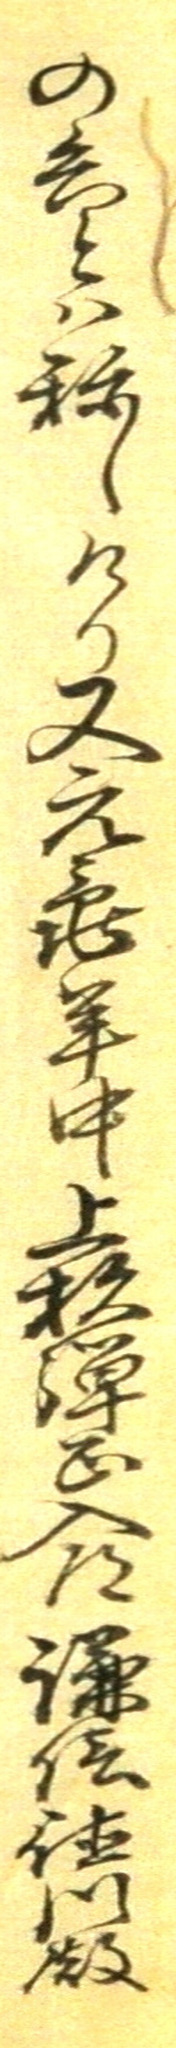の兵とは称しけり又元亀年中上杉弾正入道謙信徳川殿
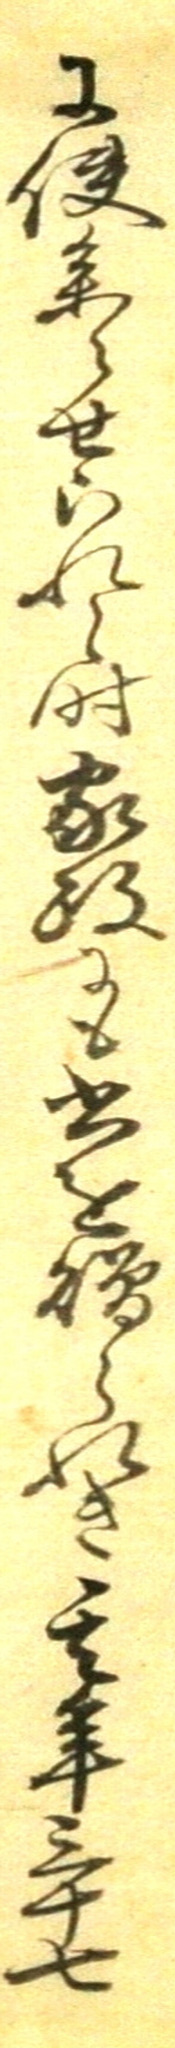に使参らせられし時家政にも書を贈られき其年三十七
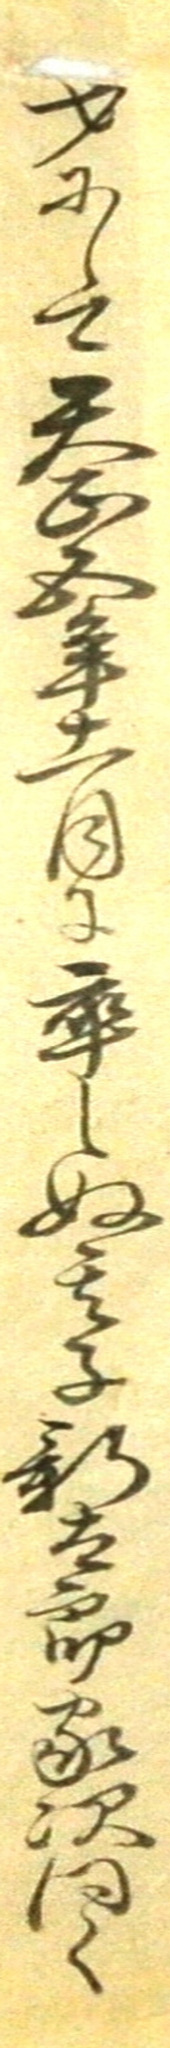才にして天正五年十一月に卒しぬ其子新太郎家次同く
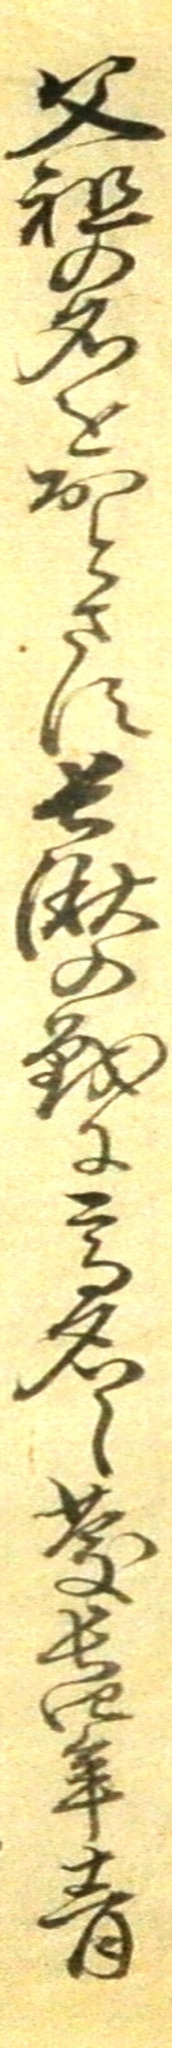父祖の名をおとさす長湫の戦に高名し慶長四年十二月
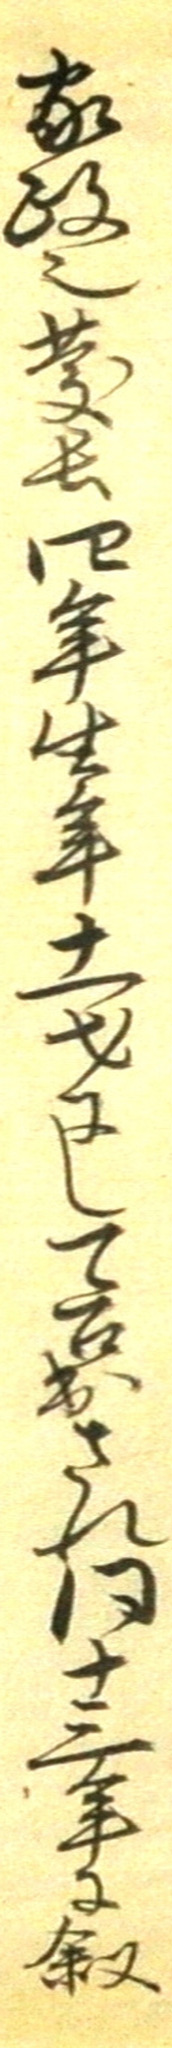家政也慶長四年生年十一才にして召出され同十三年に叙
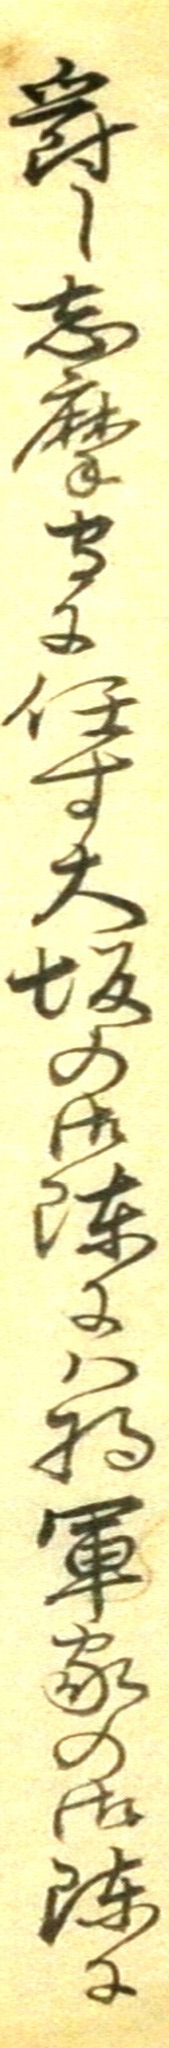爵し志摩守に任す大坂の御陣には将軍家の御陣に

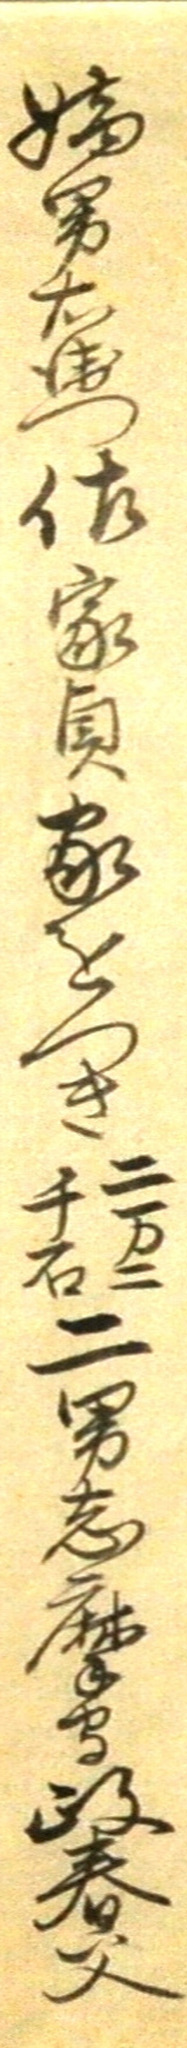嫡男右衛門佐家貞家をつき二万二千石二男志摩守政春父
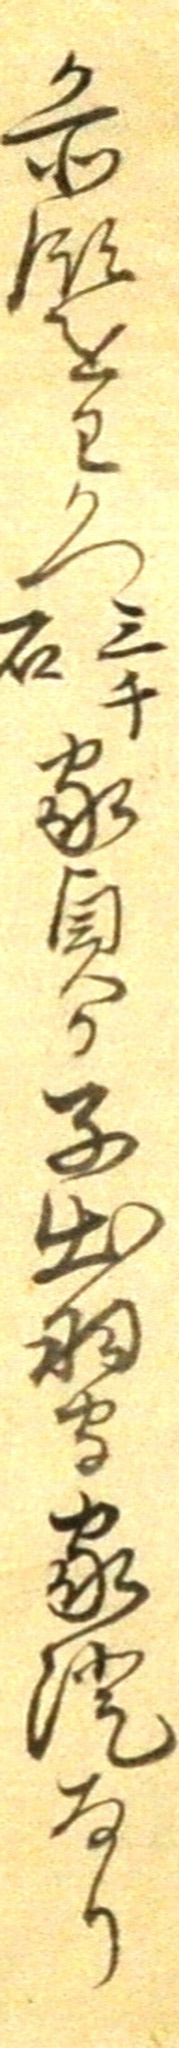か所領をわかつ三千石家貞か子出羽守家澄なり
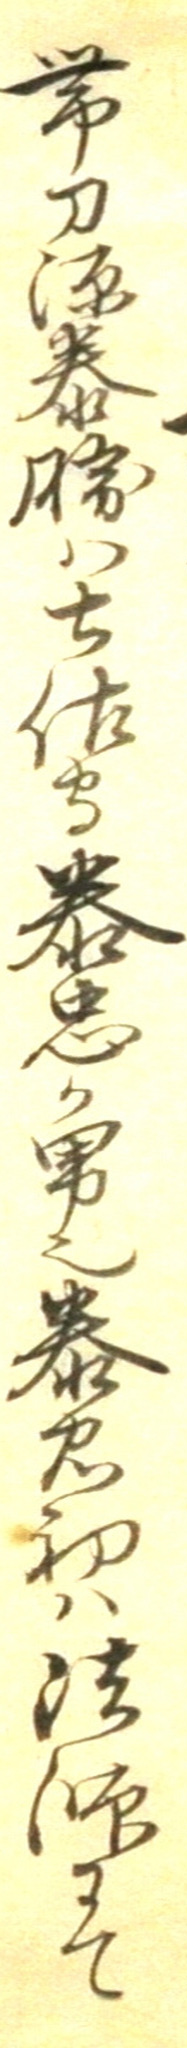帯刀源泰勝は土佐守泰忠か男也泰忠初は法師にて
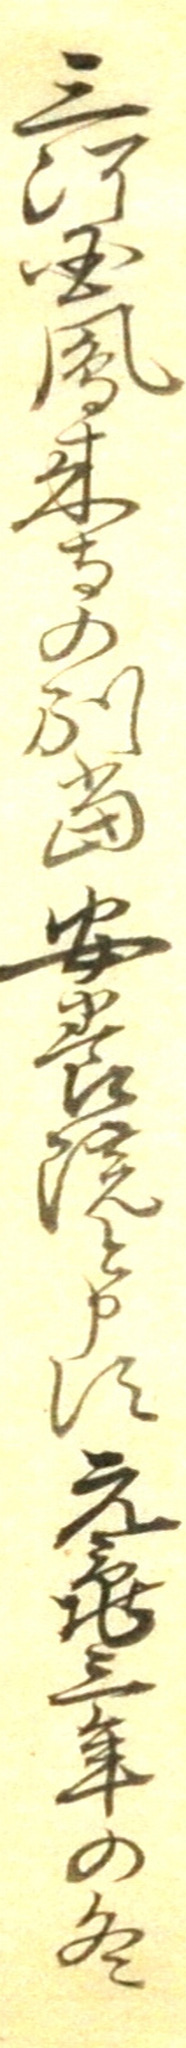三河国鳳来寺の別当安養院と申す元亀三年の冬
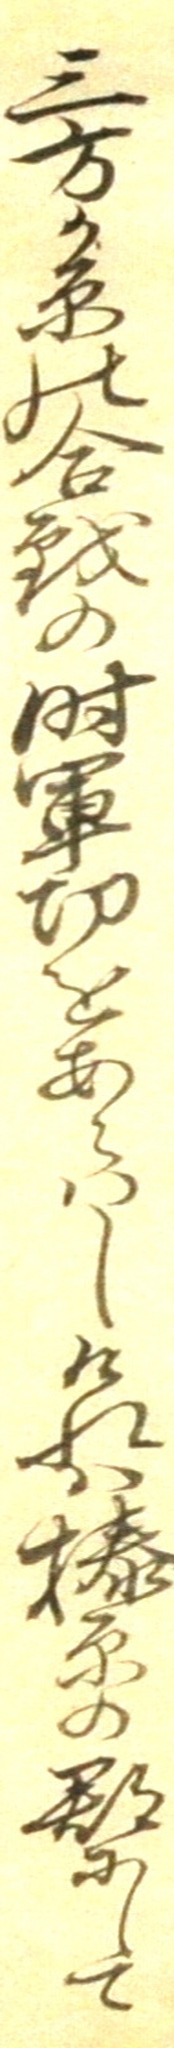三方か原の合戦の時軍功をあらはしけれは榛原の郡にして
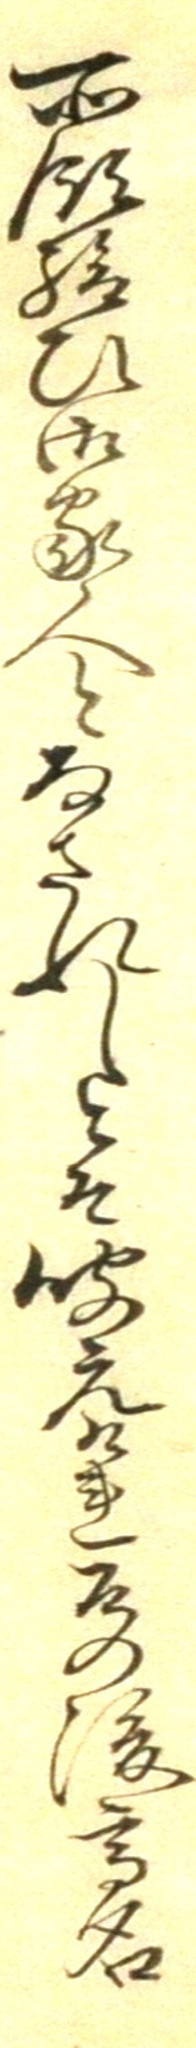所領給ひ御家人となされしとそ聞えけれその後高名
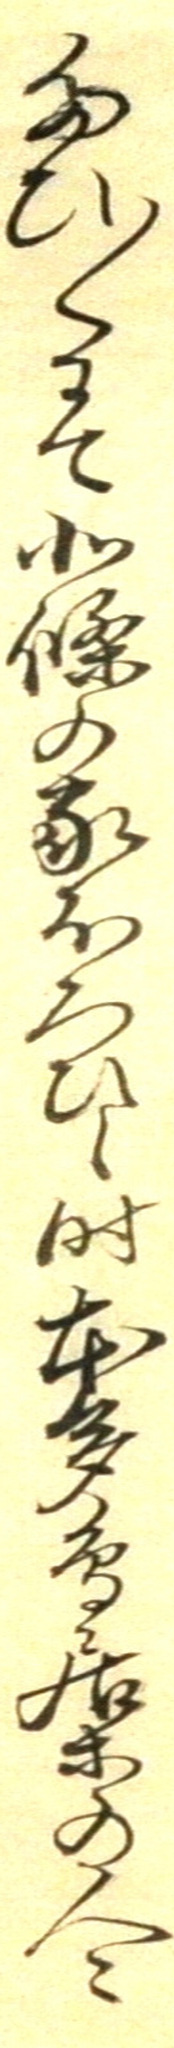たひ〳〵にて北條の家ほろひし時本多鳥居等の人々
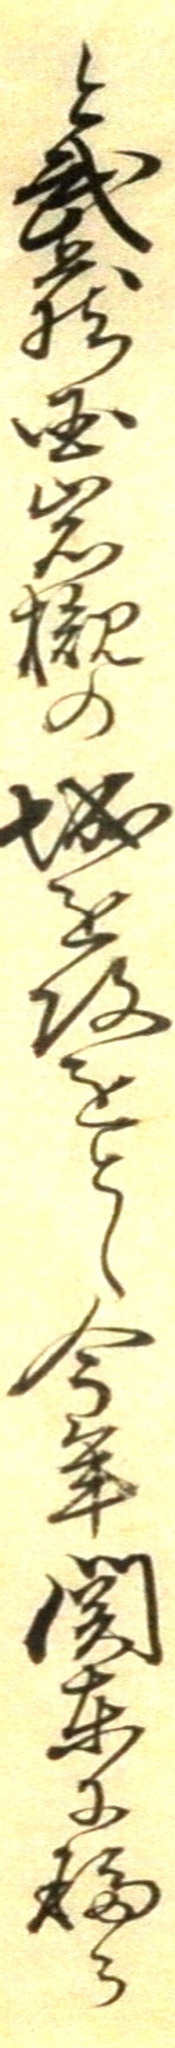と武蔵国岩槻の城を攻をとし今年関東に移ら
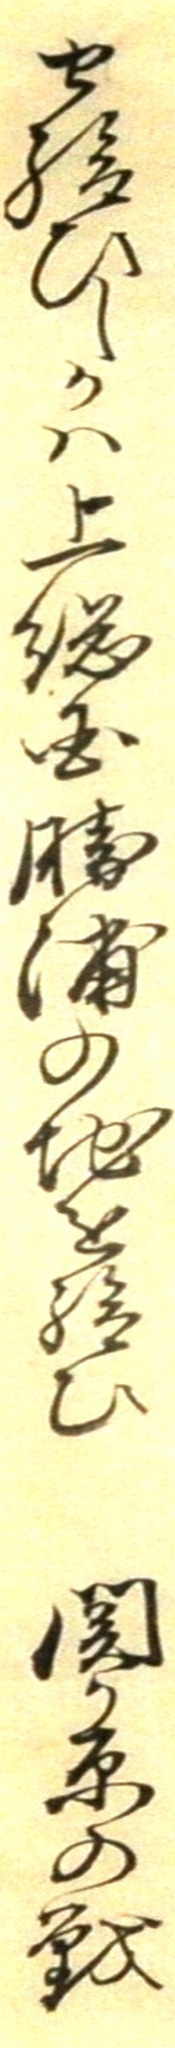せ給ひしかは上総国勝浦の地を給ひ関か原の戦
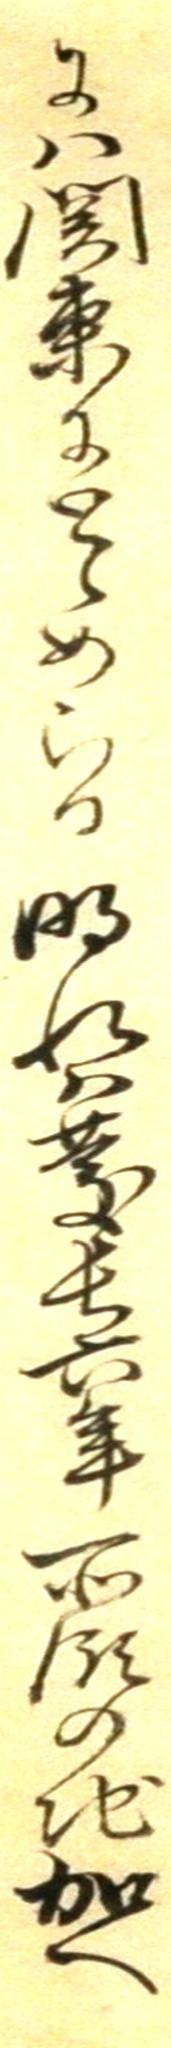には関東にとゝめらる明れは慶長六年所領の地加へ
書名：藩翰譜（四・中）
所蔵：伊那市立高遠町図書館・合同会社AMANE
